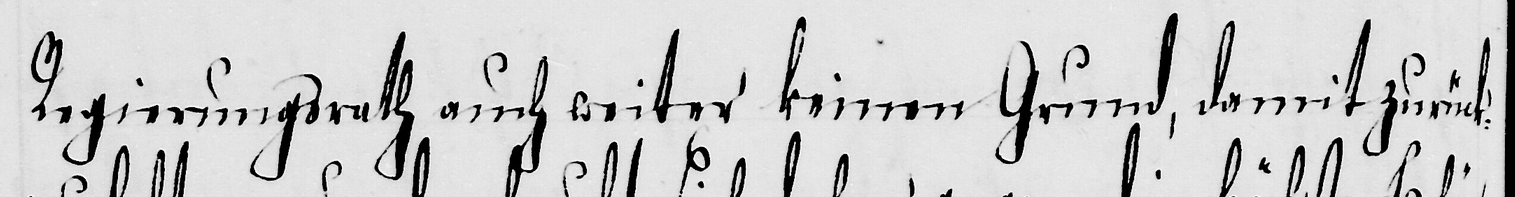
Regierungsrath auch weiter keinen Grund, damit zurüc¬
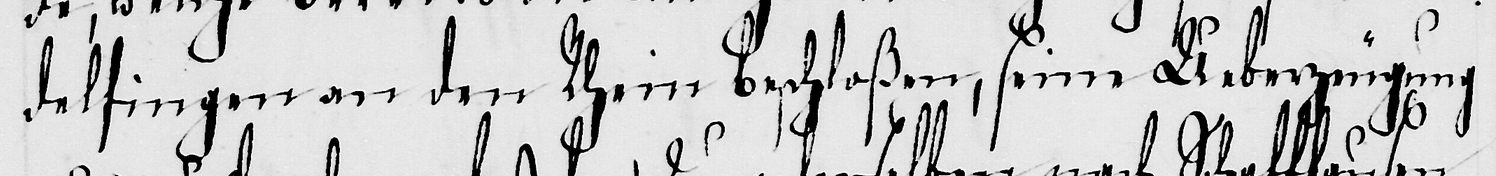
delfingen an den Rhein beschloßen, seine Ueberzeugung
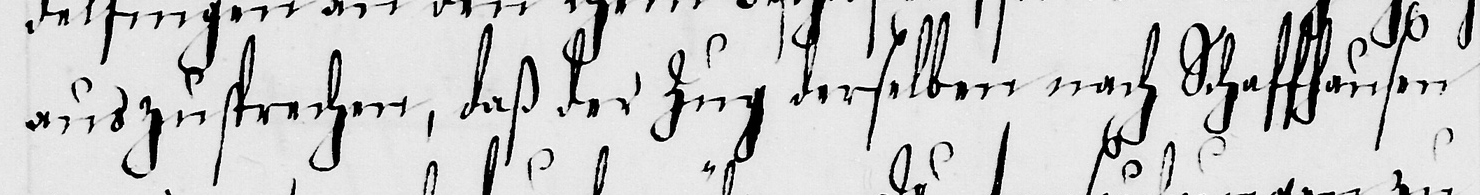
auszusprechen, daß der Zug derselben nach Schaffhausen
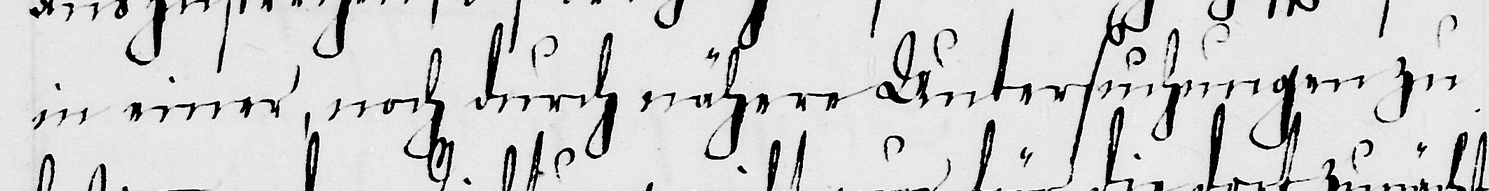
in einer, noch durch nähere Untersuchungen zu
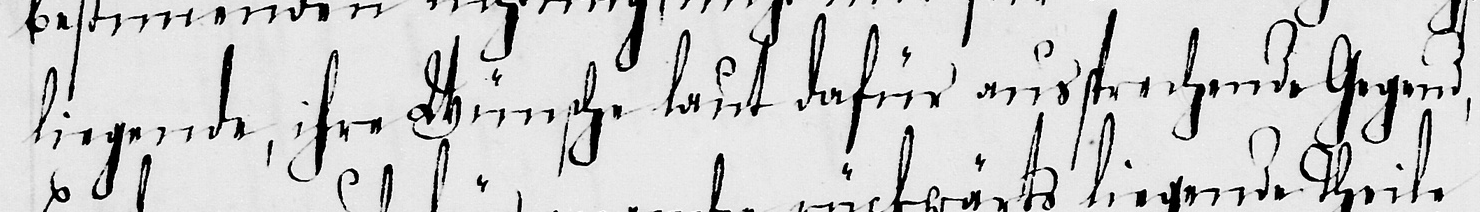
liegende, ihre Wünsche laut dafür aussprechende Gegen¬
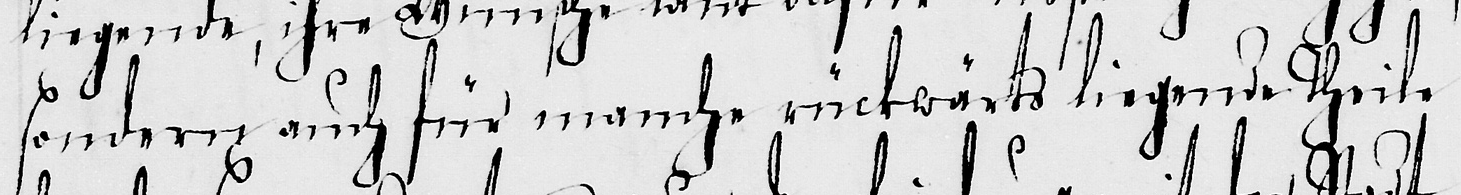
sondern auch für manche rückwärts liegende Theile
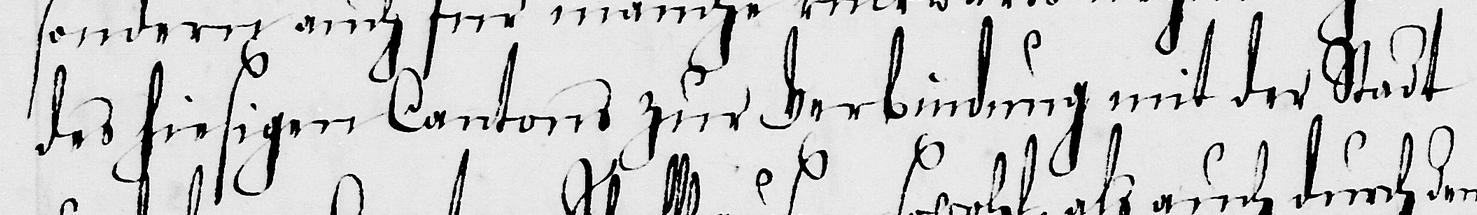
des hiesigen Cantons zur Verbindung mit der Stadt
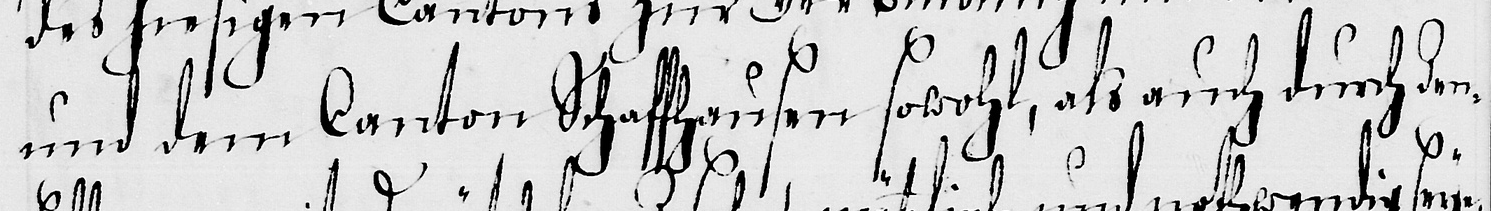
und dem Canton Schaffhausen sowohl, als auch durch d¬
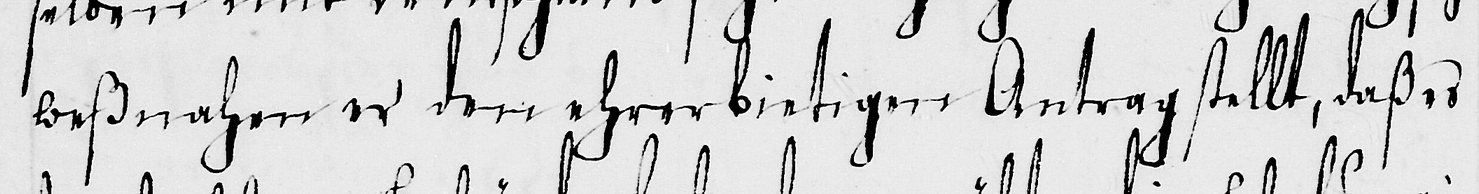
weßnahen er den ehrerbietigen Antrag stellt, daß es
